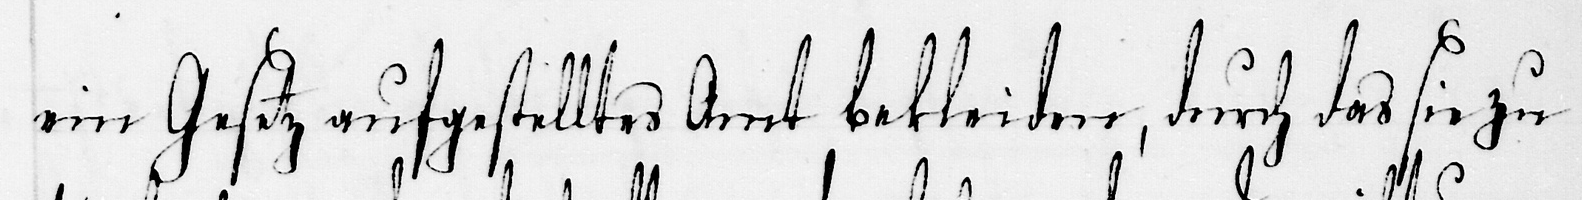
in Gesetz aufgestelltes Amt bekleiden, durch das sie
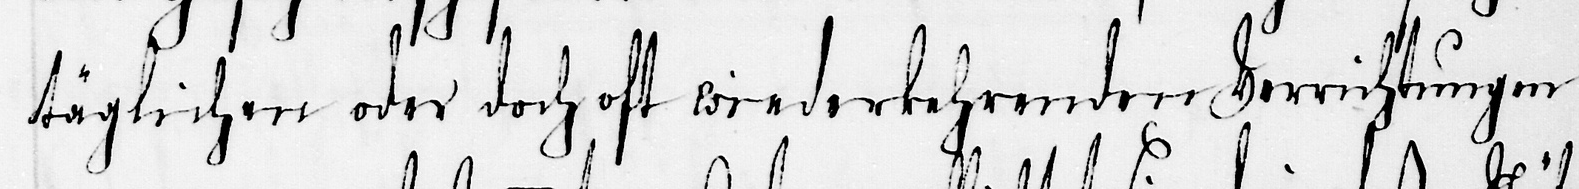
täglichen oder doch oft wiederkehrenden Verrichtungen
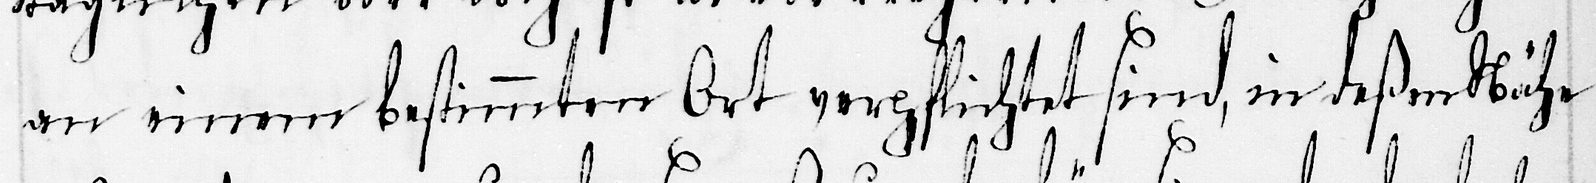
an einem bestimmten Ort verpflichtet sind, in deßen Nähe
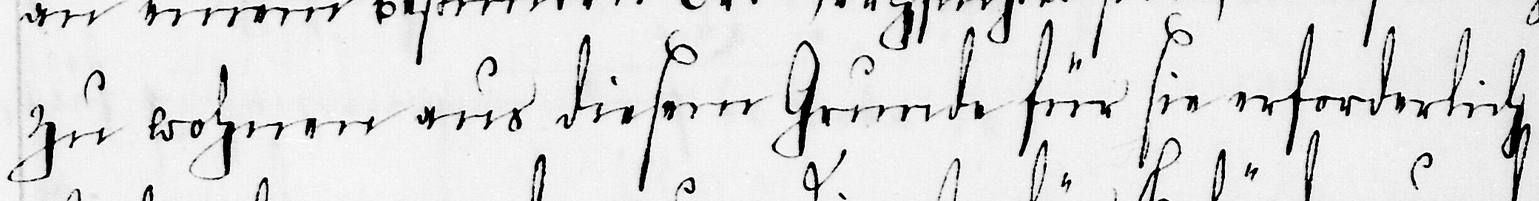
zu wohnen aus diesem Grunde für sie erforderlich
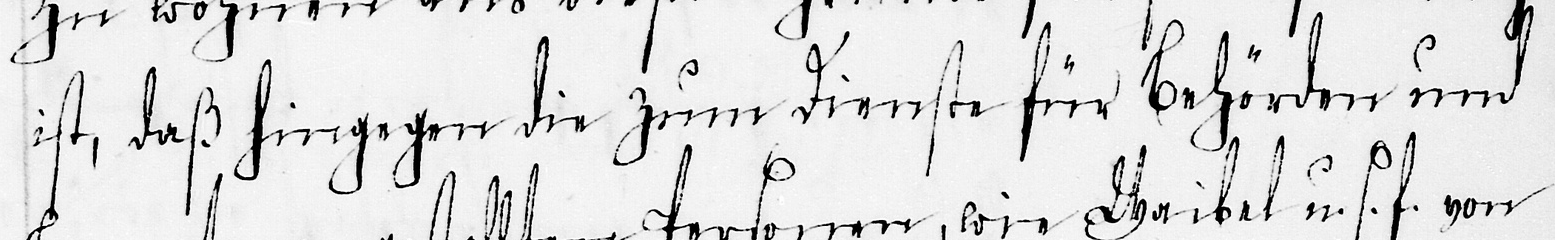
ist, daß hingegen die zum Dienste für Behörden und
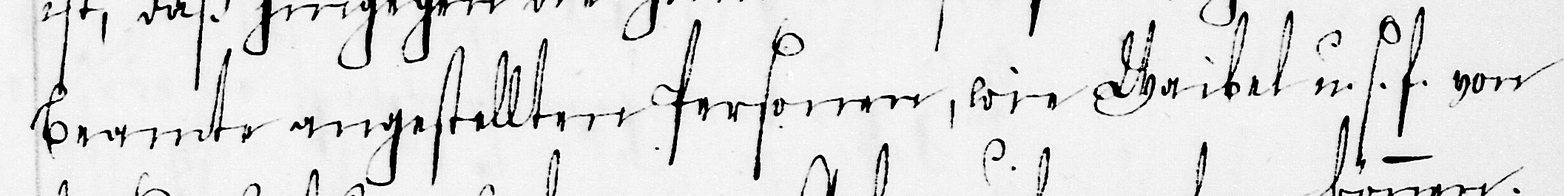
Beamte angestellten Personen, wie Waibel u. s. f. von
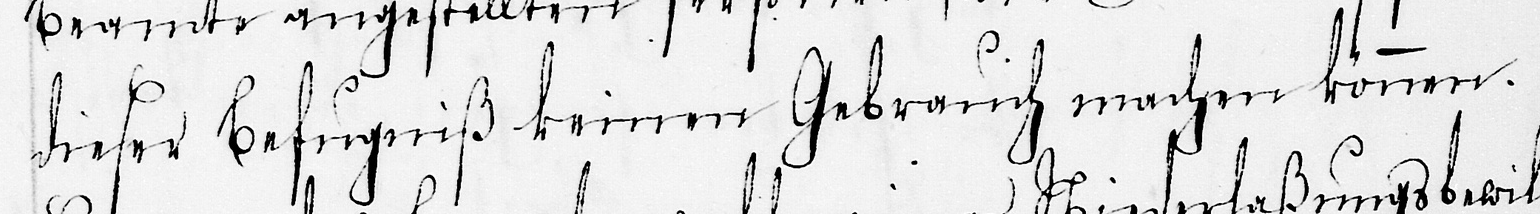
dieser Befugniß keinen Gebrauch machen können.
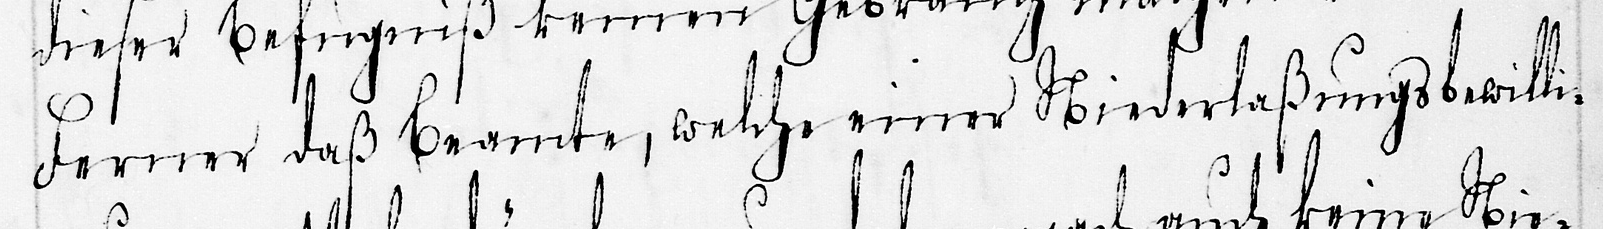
Ferner daß Beamte, welche einer Niederlaßungsbewill¬
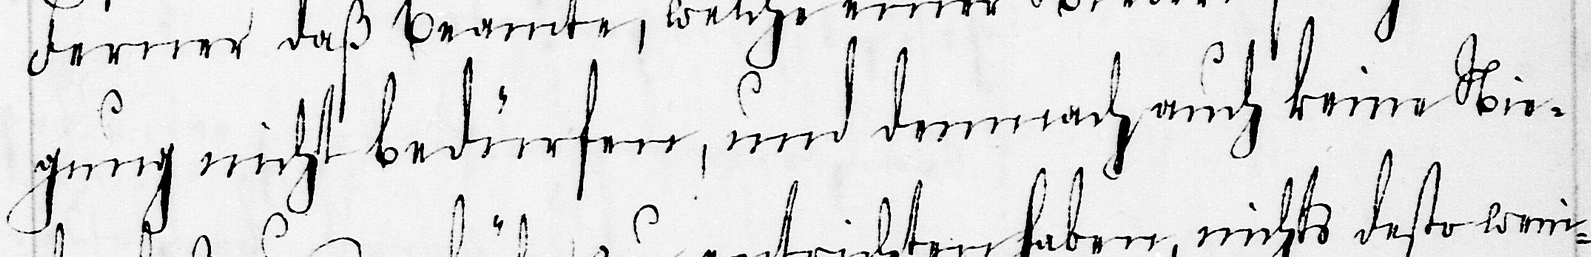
igung nicht bedürfen, und demnach auch keine Nie¬
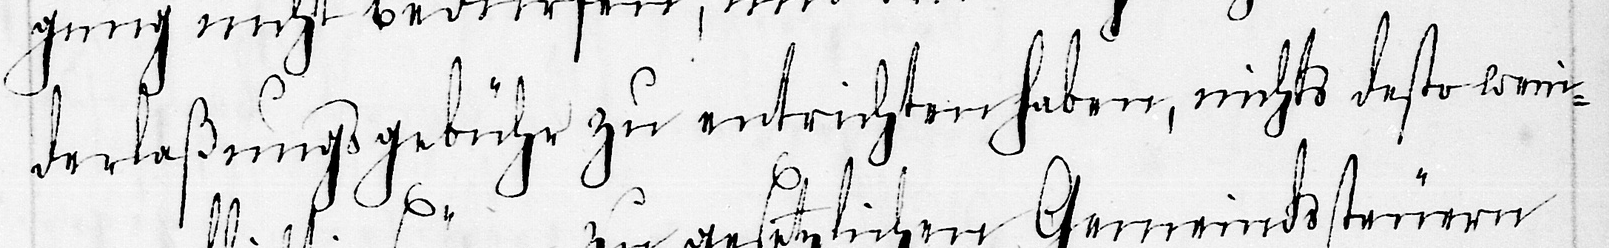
derlaßungsgebühr zu entrichten haben, nichts desto weni¬
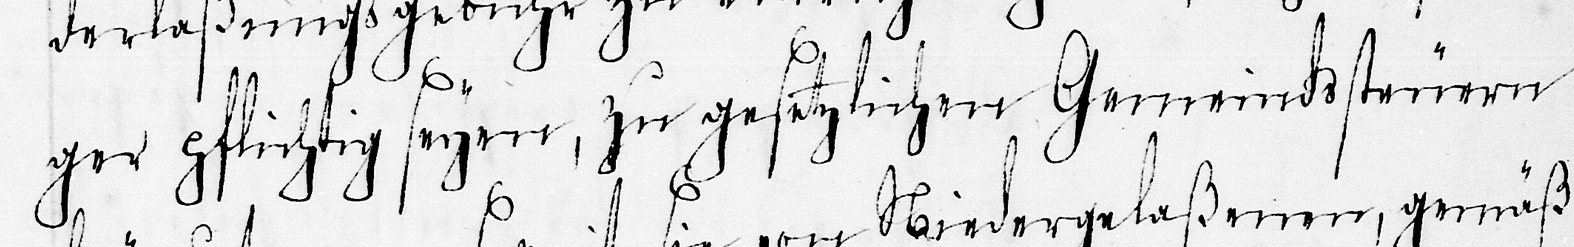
ger pflichtig seyen, zu gesetzlichen Gemeindssteuern
